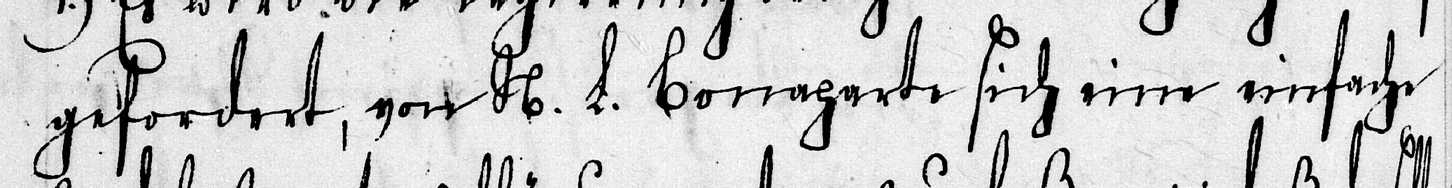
gefordert, von N. L. Bonaparte sich eine einfache
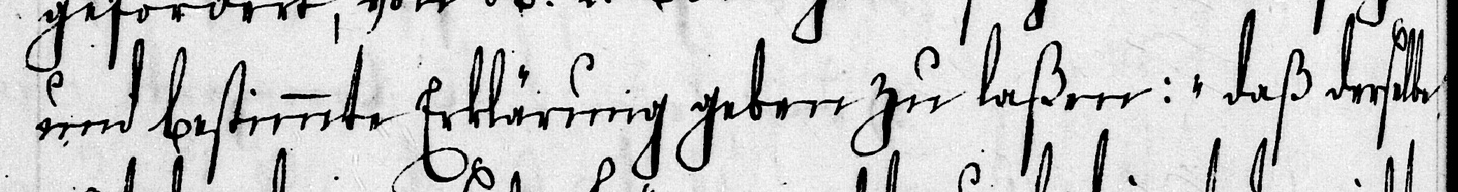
und bestimmte Erklärung geben zu laßen: „daß derselbe
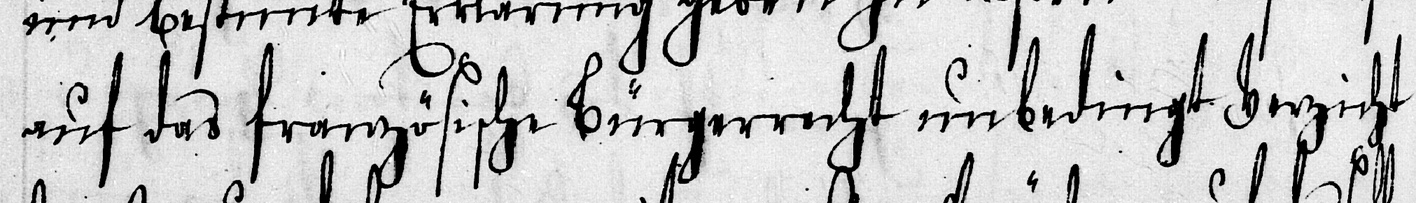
auf das französische Bürgerrecht unbedingt Verzicht
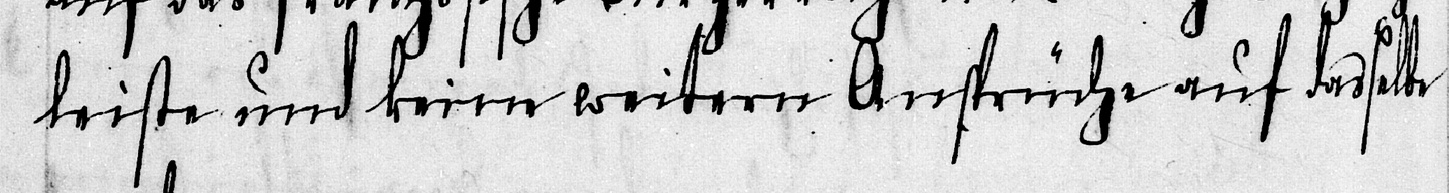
leiste und keine weitern Ansprüche auf dassel¬
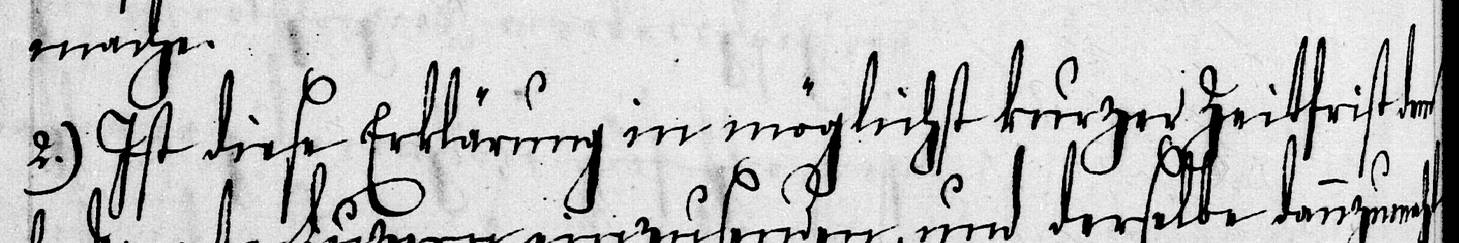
2.) Ist diese Erklärung in möglichst kurzer Zeitfrist
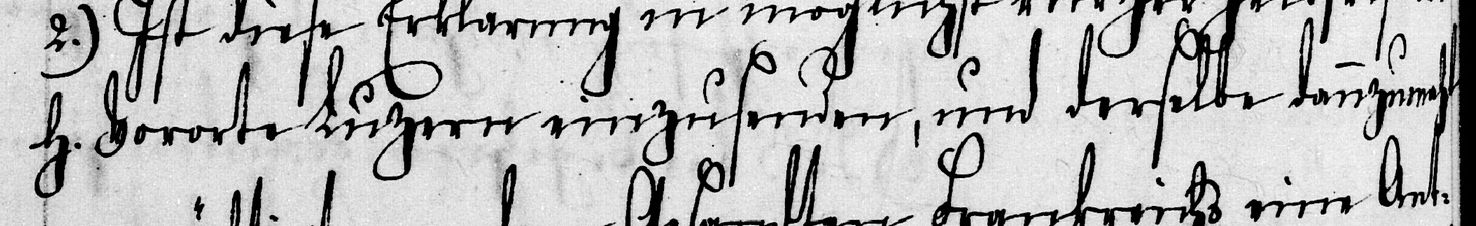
H. Vororte Luzern einzusenden, und derselbe dannzu¬
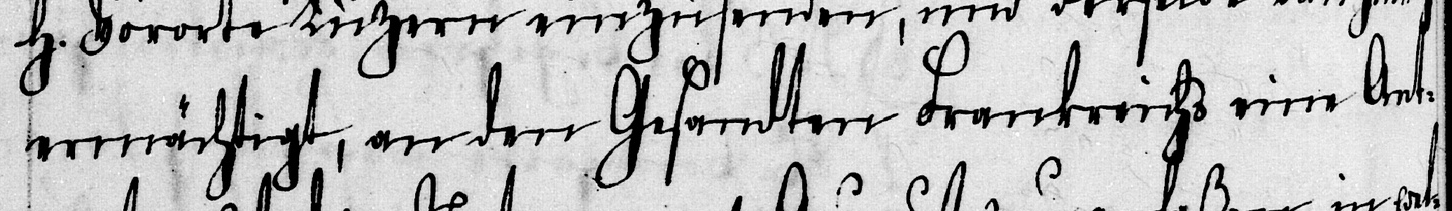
ermächtigt, an den Gesandten Frankreichs eine Ant¬
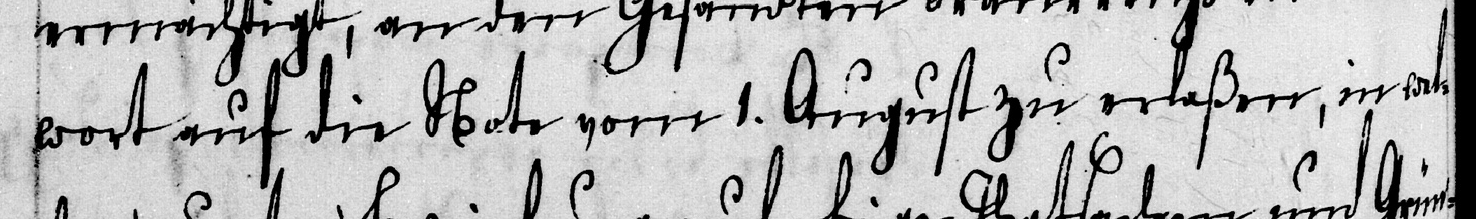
wort auf die Note vom 1. August zu erlaßen, in wel¬
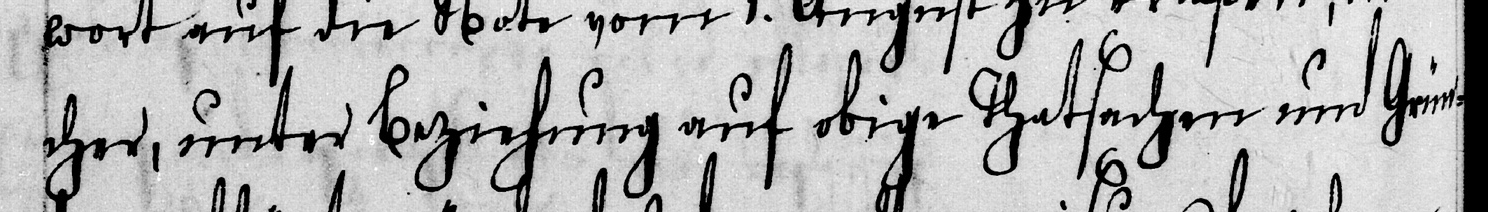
cher, unter Beziehung auf obige Thatsachen und Grü¬
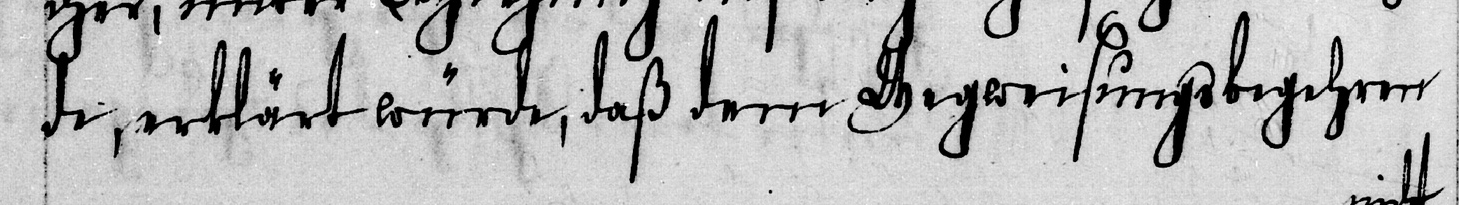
nde, erklärt würde, daß dem Wegweisungsbegehren
